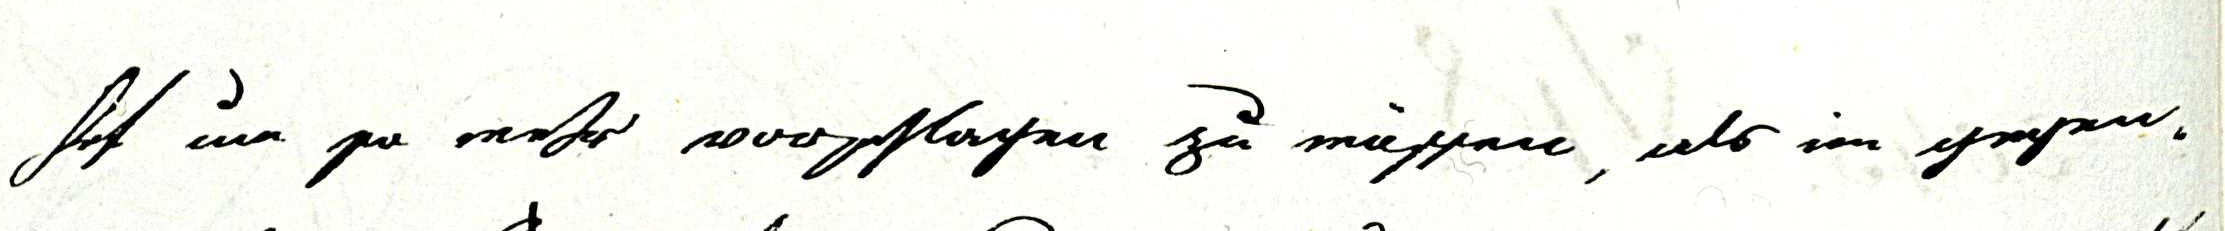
hof um so mehr vorschlagen zu müssen, als im gegen¬
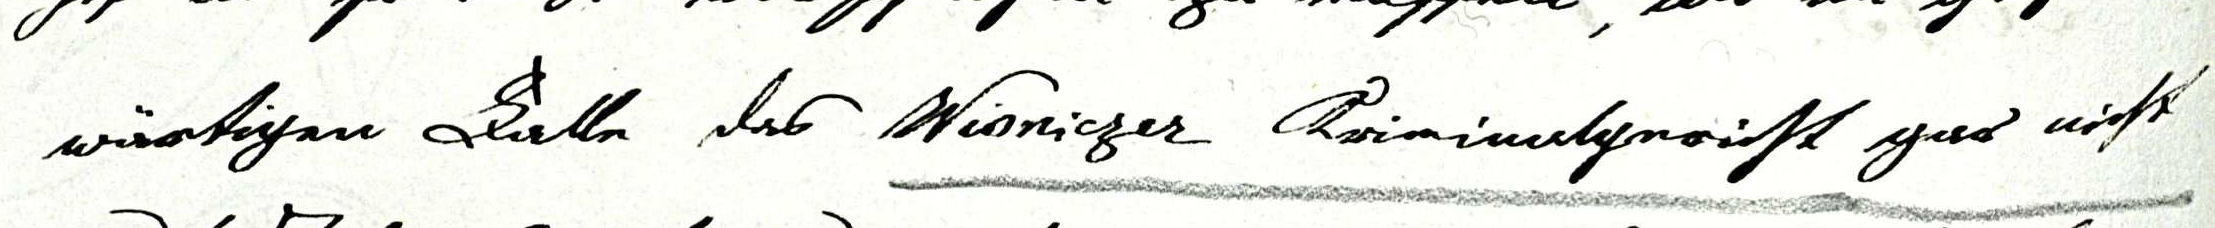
wärtigen Falle des Wisniczer Kriminalgericht gar nicht
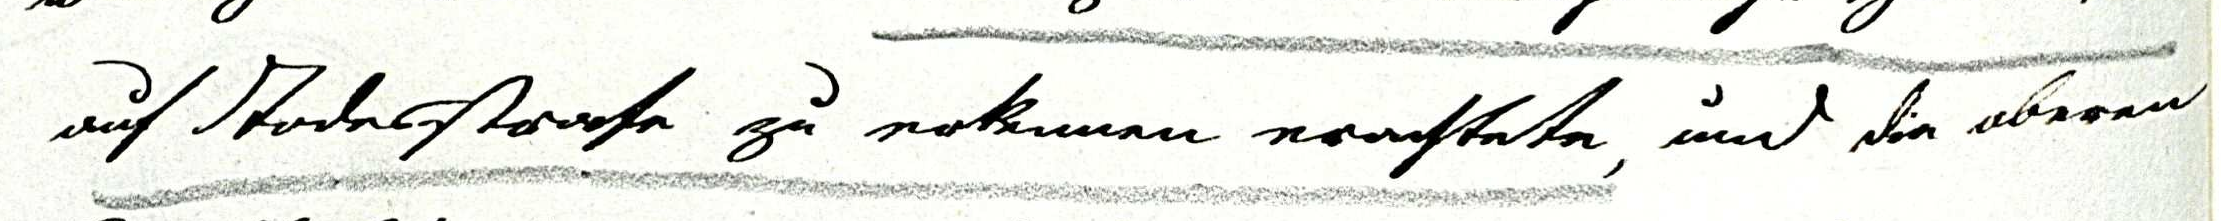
auf Todesstrafe zu erkennen erachtete, und die oberen
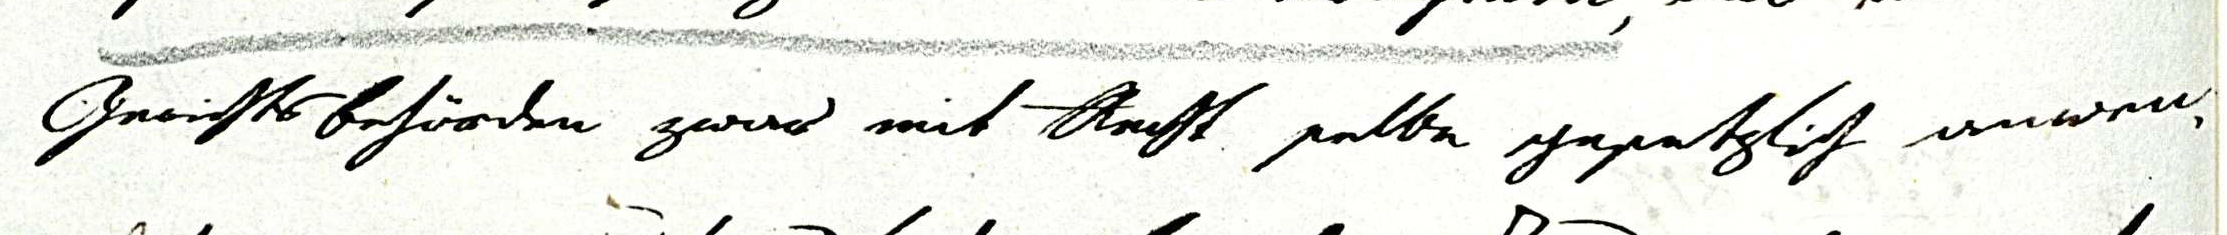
Gerichtsbehörden zwar mit Recht selbe gesetzlich anwen¬
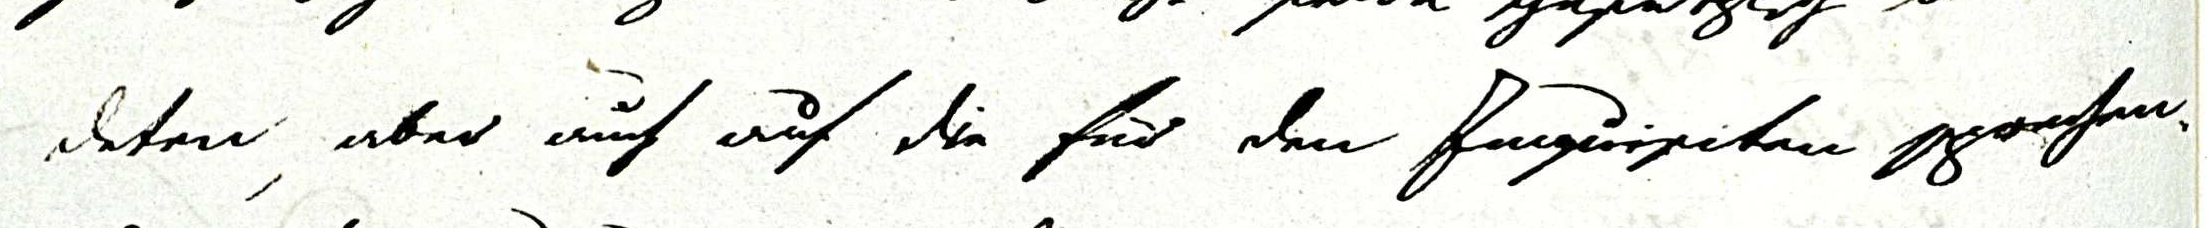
deten, aber auch auf die für den Inquisiten sprechen¬
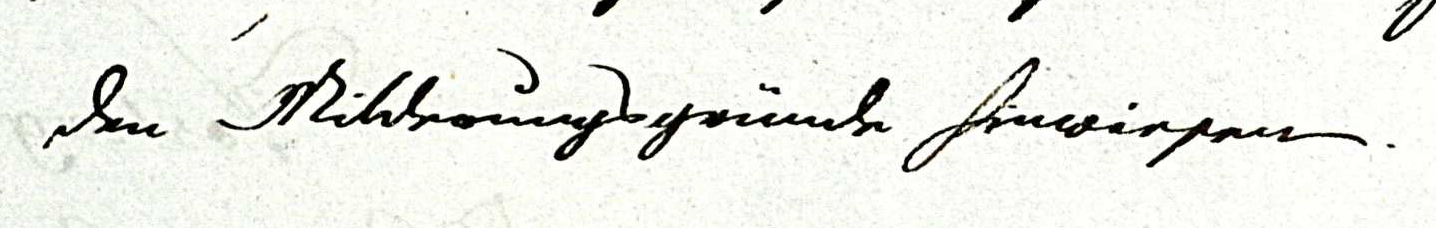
den Milderungsgründe hinwiesen.
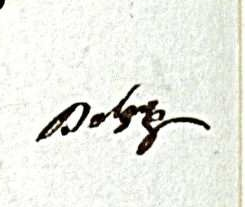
Johann Bolza
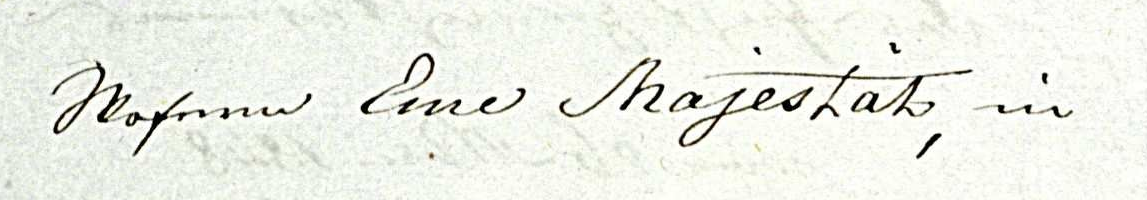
Wofern Eure Majestät, in
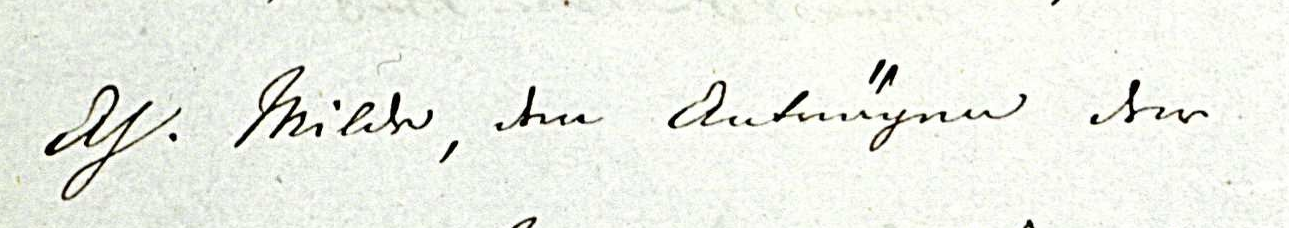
Ah. Milde, den Anträgen der
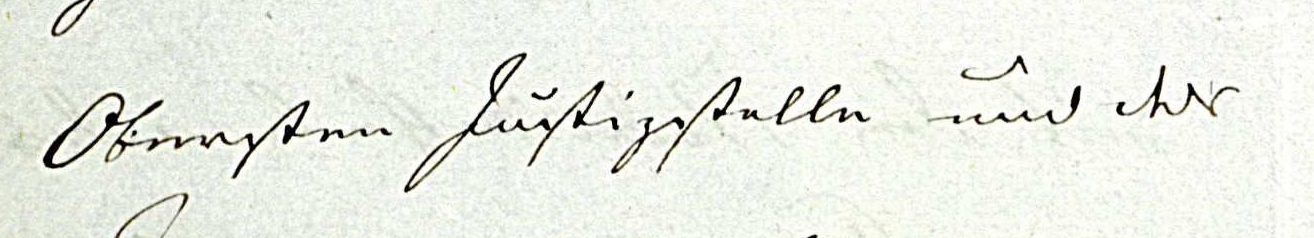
Obersten Justizstelle und der
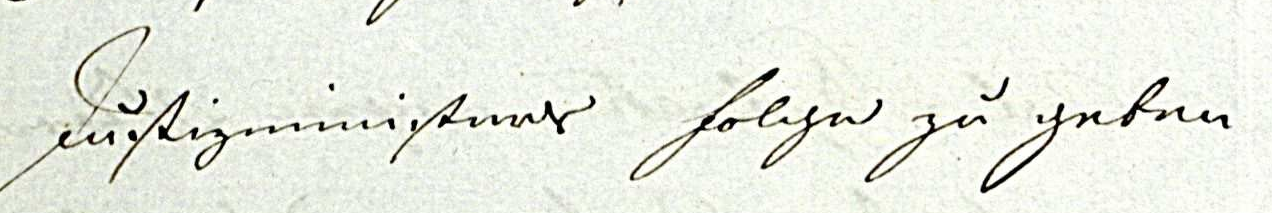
Justizministers Folge zu geben
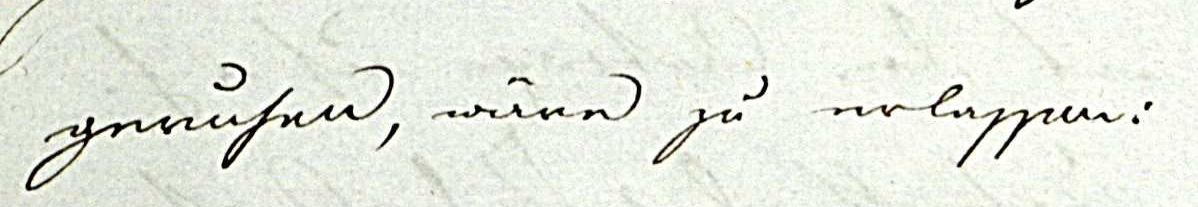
geruhen, wäre zu erlassen:
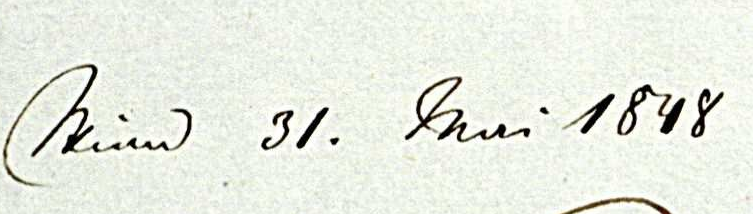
Wien, 31 Mai 1848
